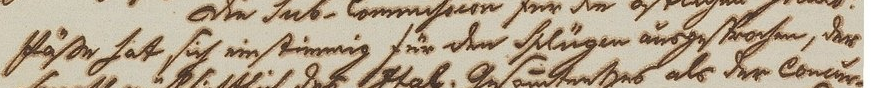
Päße hat sich einstimmig für den Splügen ausgesprochen, der
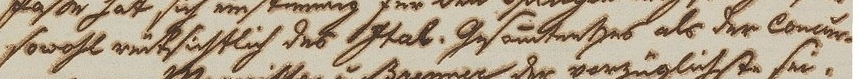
sowohl rücksichtlich des Ital. Gesammtnetzes als der Concur-
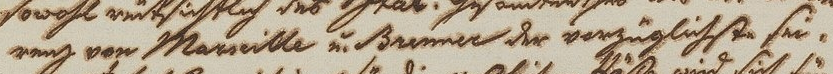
renz von Marseille u. Brenner der vorzüglichste sei.
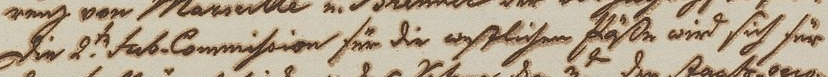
Die 2te Sub-Commission für die westlichen Päße wird sich für
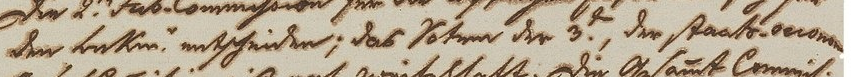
den Lukm. entscheiden; das Votum der 3ten, der staatsoeconom.
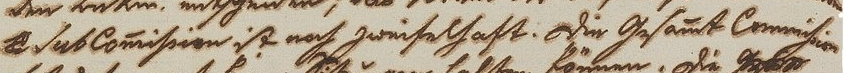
& Subcommission ist noch zweifelhaft. Die Gesammt Commission
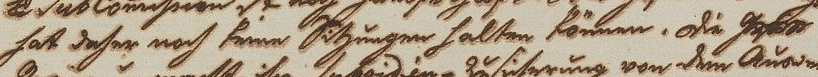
hat daher noch keine Sitzungen halten können. Die Gesam
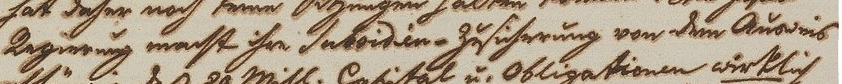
Regierung macht ihre Subsidien-Zusicherung von dem Ausweis
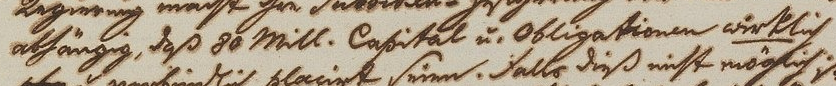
abhängig, daß 80 Mill. Capital u. Obligationen wirklich
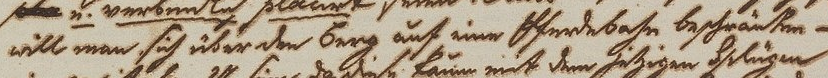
will man sich über den Berg auf eine Pferdebahn beschränken –
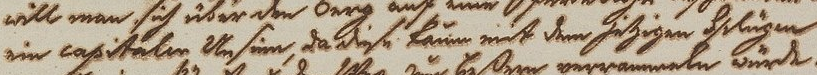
ein capitaler Unsinn, da diese kaum mit dem jetzigen Splügen
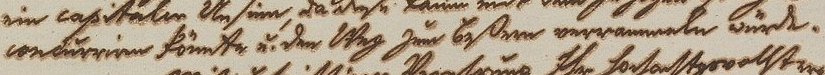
concurriren könnte u. den Weg zum Beßern verrammeln würde.
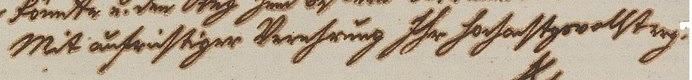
Mit aufrichtiger Verehrung Ihr hochachtungsvollsterg.
